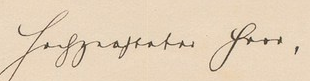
Hochgeachteter Herr,
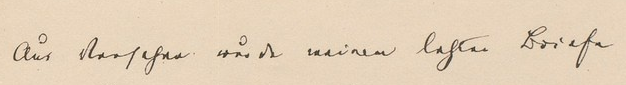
Aus Versehen wurde meinem letzten Briefe
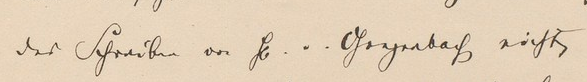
das Schreiben von H. v. Gonzenbach nicht
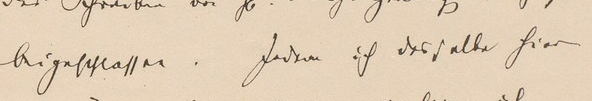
beigeschlossen. Indem ich dasselbe hier
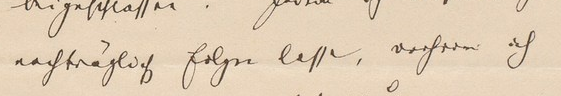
nachträglich folgen lasse, verharre ich
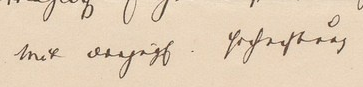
mit vorzügl. Hochachtung
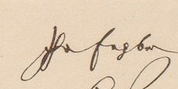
Ihr Ergbener
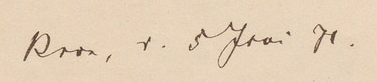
Bern, d. 5 Juni 71.
